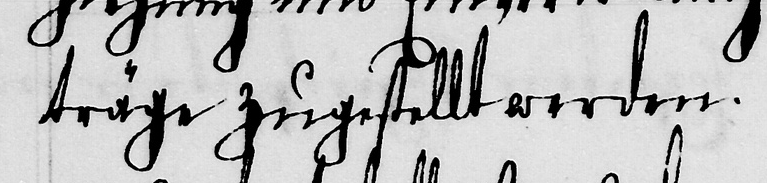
träge zugestellt werden.
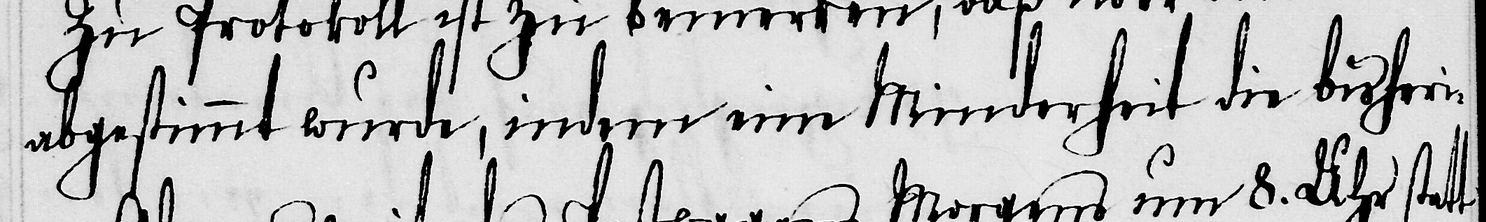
abgestimmt wurde, indem eine Minderheit die bisheri¬
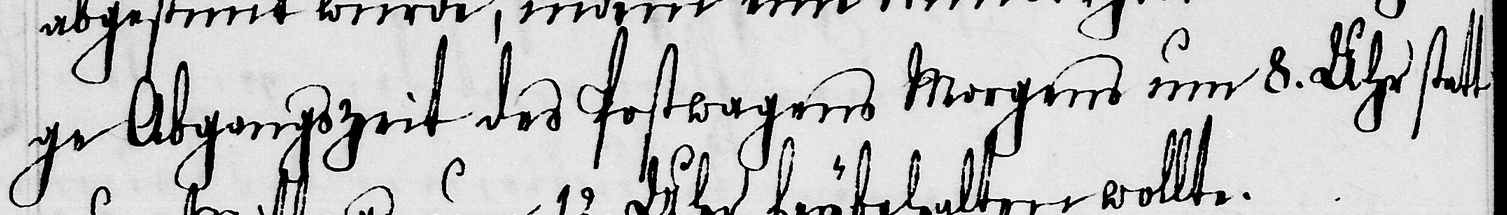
ge Abgangszeit des Postwagens Morgens um 8. Uhr stat¬
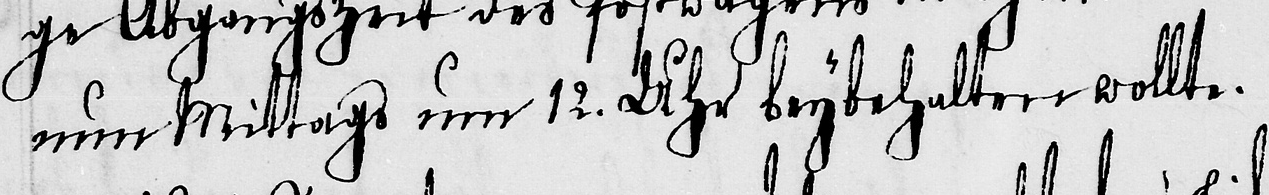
nun Mittags um 12. Uhr beybehalten wollte.
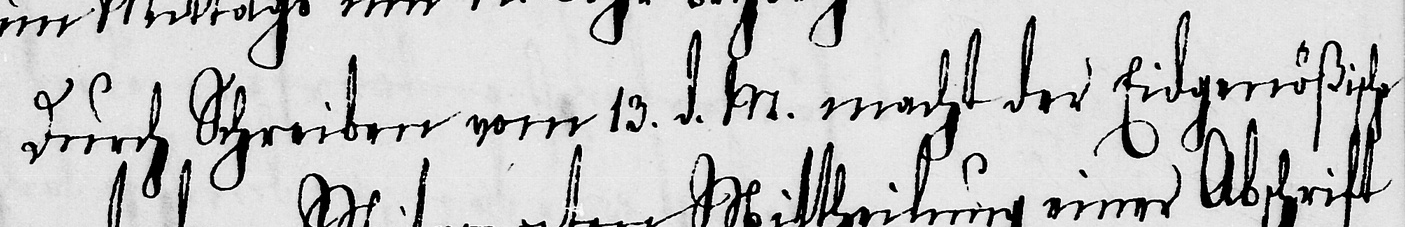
Durch Schreiben vom 13. d. M. macht der Eidgenößis¬
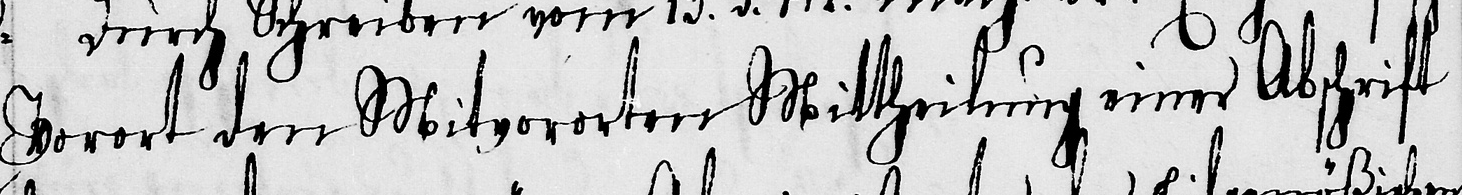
Vorort den Mitvororten Mittheilung einer Abschrift
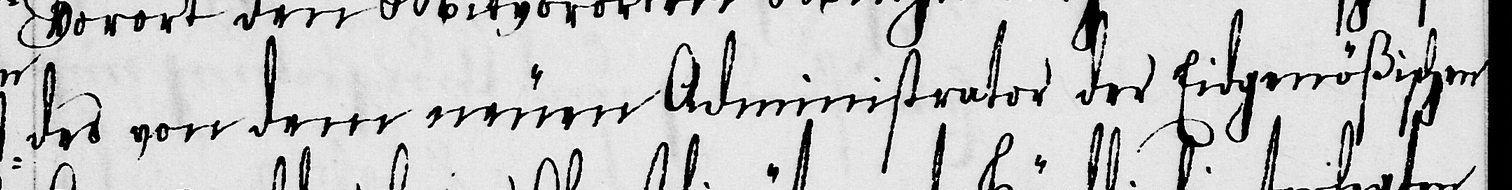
des von dem neuen Administrator der Eidgenößischen
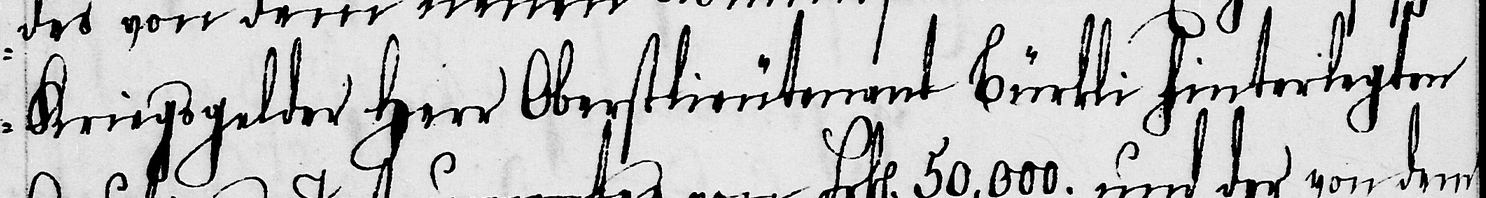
Kriegsgelder Herr Oberstlieutenant Bürkli hinterlegten
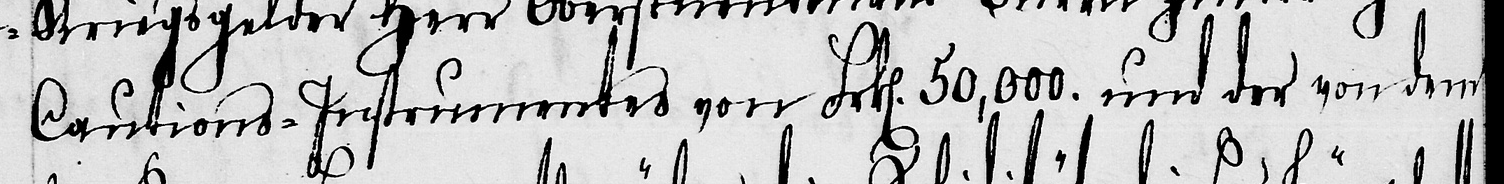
Cautions-Instrumentes von Frk[en]. 50,000. und der von dem
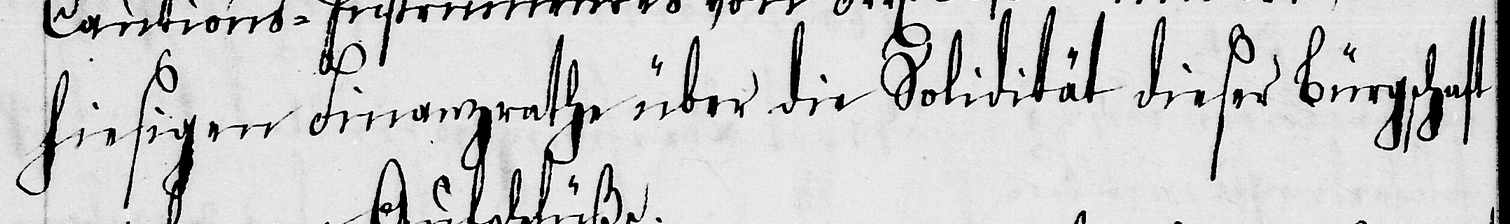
hiesigen Finanzrathe über die Solidität dieser Bürgscha¬
